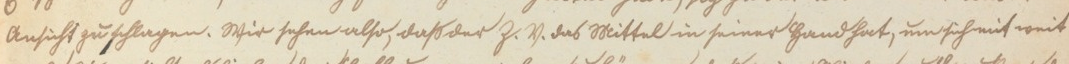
Ansicht zu schlagen. Wir sehen also, dass der Z.V. das Mittel in seiner Hand hat, um sich mit weit
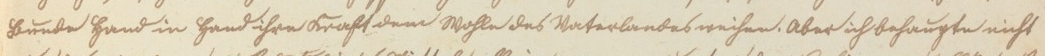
Bunde Hand in Hand ihre Kraft dem Wohle des Vaterlandes weihen. Aber ich behaupte nicht
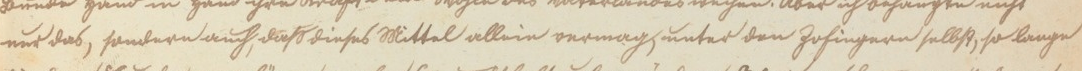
nur das, sondern auch, dass dieses Mittel allein vermag, unter den Zofingern selbst, so lange
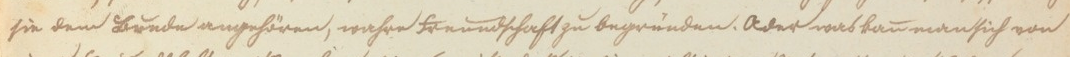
sie dem Bunde angehören, wahre Freundschaft zu begründen. Oder was kann man sich von
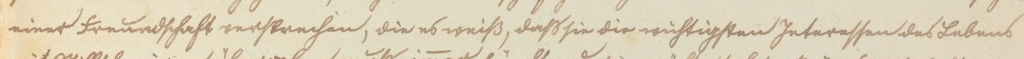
einer Freundschaft versprechen, die es weiß, dass sie die wichtigsten Interessen des Lebens
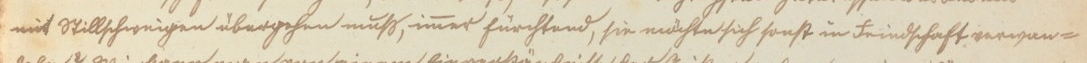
mit Stillschweigen übergehen muss, immer fürchtend, sie möchte sich sonst in Feindschaft verwan-
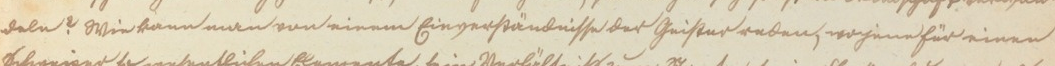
deln? Wie kann man von einem Einverständnisse der Geister reden, wo jene für einen
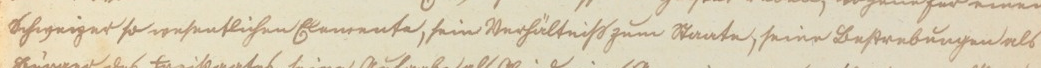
Schweizer so wesentliche Elemente, sein Verhältniss zum Staate, seine Bestrebungen als
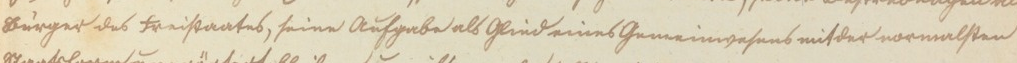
Bürger des Freistaates, seine Aufgabe als Glied eines Gemeinwesens mit der normalsten
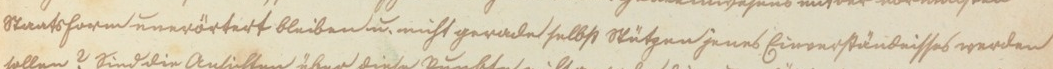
Staatsform unerörtert bleiben u. nicht gerade selbst Stützen jenes Einverständnisses werden
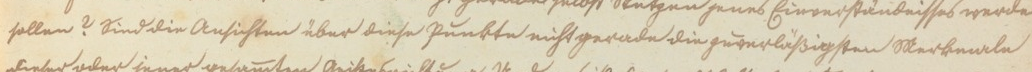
sollen? Sind die Ansichten über diese Punkte nicht gerade die zuverläßigsten Merkmale
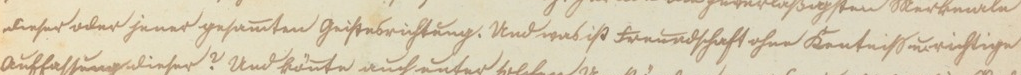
dieser oder jener gesammten Geistesrichtung. Und was ist Freundschaft ohne Kentniss u. richtige
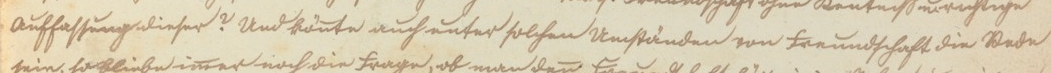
Auffassung dieser? Und könnte auch unter solchen Umständen von Freundschaft die Rede
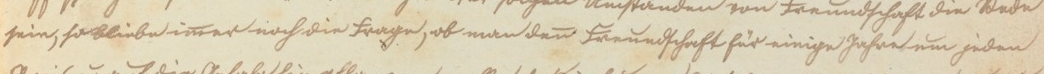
sein, so bliebe immer noch die Frage, ob man denn Freundschaft für einige Jahre um jeden
